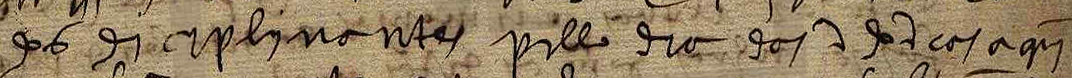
dos dycyplynantes pello dya das ēdoēças a quȳ
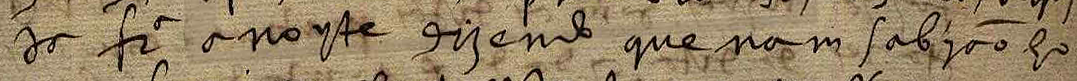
ta fra a noyte dizendo que nam sabyão ho
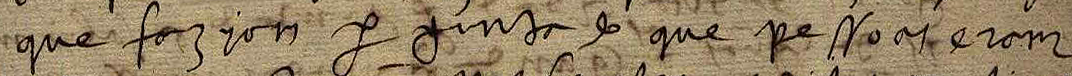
que fazyam ꝑguntado que pessoas eram
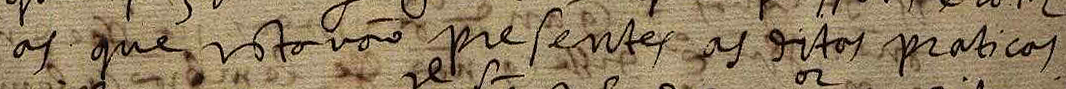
as que estauaõ presentes as dytas praticas
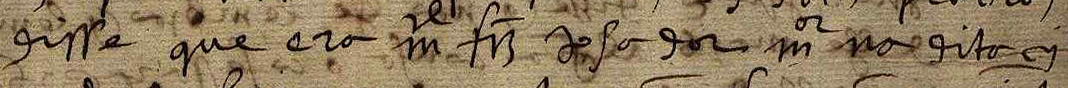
disse que era mel fr̄z tosador mor na dita cy
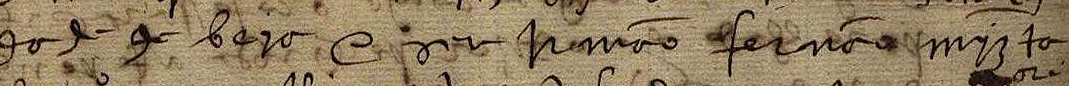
dade de beya e seu Jrmão fernão myz̄ta
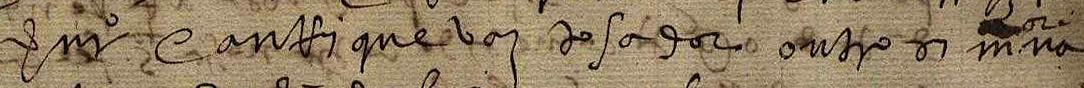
ꝟnro e anRyque vaz tosador outrosi mor na
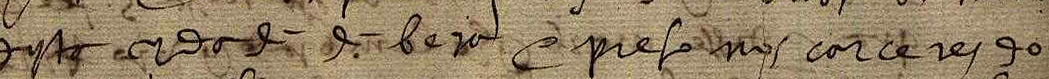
dyta cydade de beya e preso nos carceres do
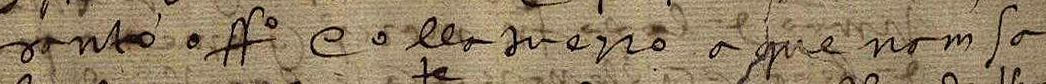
santo offo e o llatueyro a que nam sa
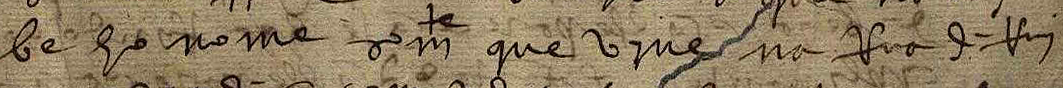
be ho nome somte que viue na Rua de Ruy
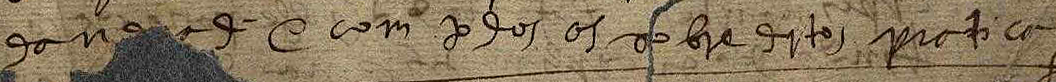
dandrade e com todos os sobredytos pratica
